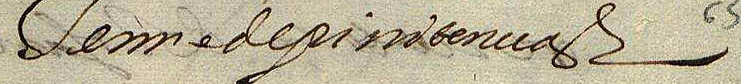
Termo de pinitencia
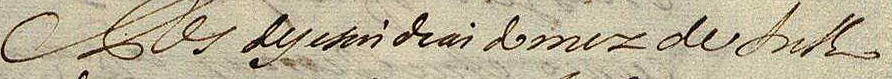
Aos deseseis dias do mez de Iulho
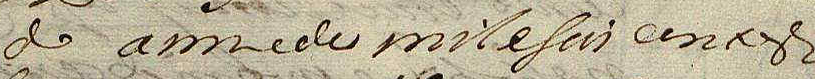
do anno de mil e seiscentos
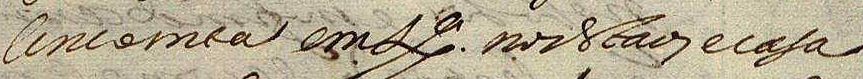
cincoenta em Lxa. nos estaos e casa
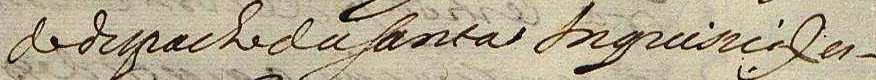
do despacho da santa Inquisiçaõ es
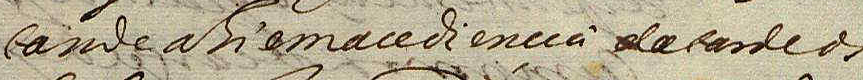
tando ahi em audiençia da tarde os
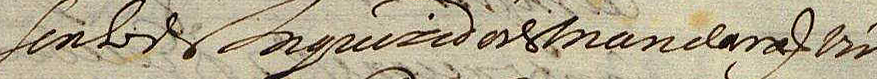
senhores Inquizidores mandaraõ vir
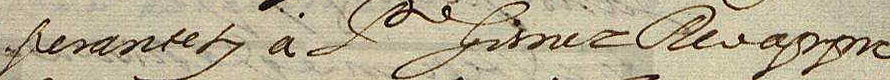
perante sj a Po Gomez Reo appre
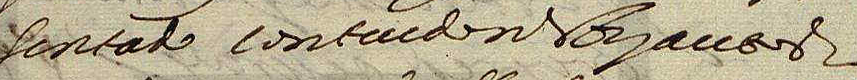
sentado conteudo nestes autos
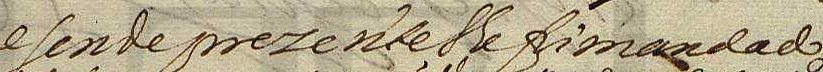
e sendo prezente lhe foi mandado
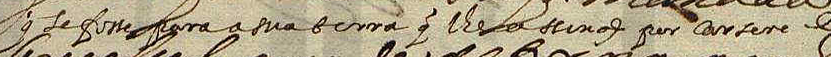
q̄ se fosse para a sua terra q̄ lhe assinaõ por carsere e
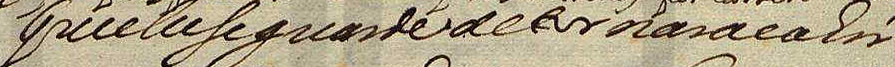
que elle se guarde de tornar a cahir
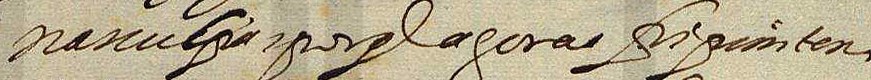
nas culpas por q̄ agora foi peniten
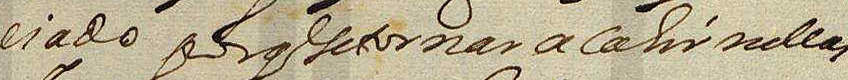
ciado porq̄ se tornar a cahir nellas
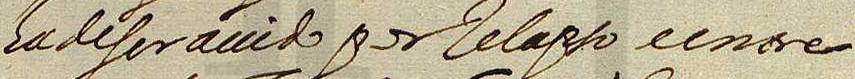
hade ser auido por Relapso e entre
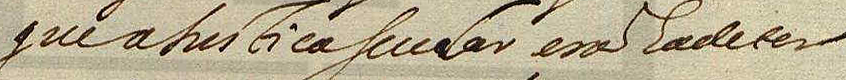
gue a Iustica secular e naõ hade ter
